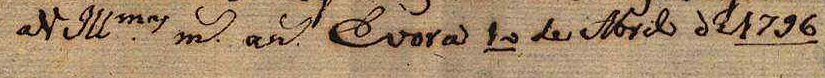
a V Ill.mas m̄. an.s Evora 10 de Abril de 1796
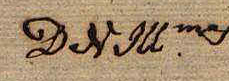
De V. Illmas
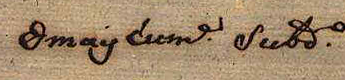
O mais hum.e Subd.o
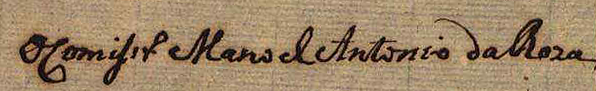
O Comissr.o Manoel Antonio da Roza
